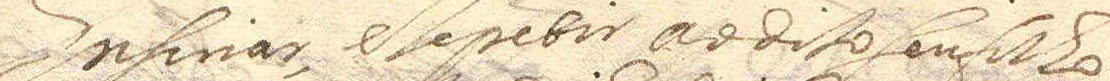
Ensinar, e Repetir ao dito seu filho
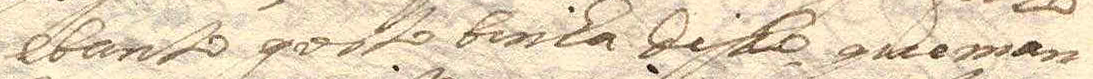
e tanto gosto tinha disso que man
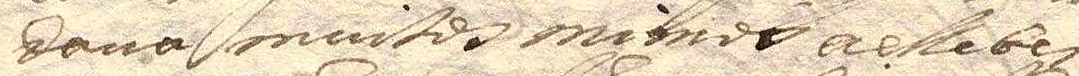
dava muitos mimos a elle tes
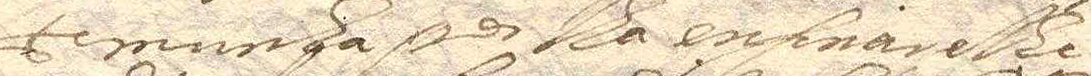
temunha por lha ensinar e lhe
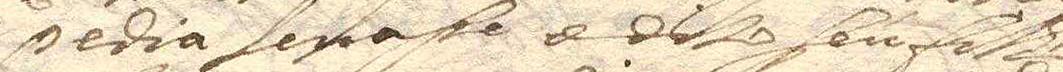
pedia levasse o dito seu filho
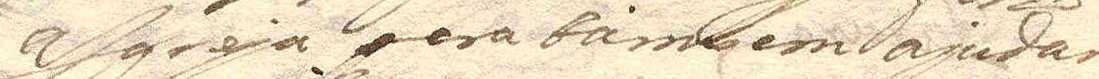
a Jgreja para também ajudar
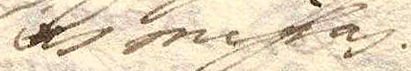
as missas.
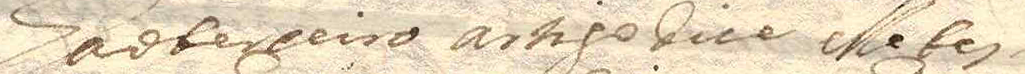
E ao terceiro artigo dice elle tes
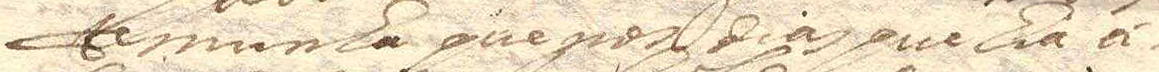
temunha que nos dias que hia á
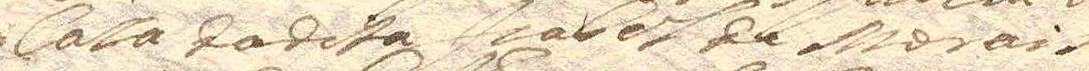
Caza da dita Jzabel de Morais
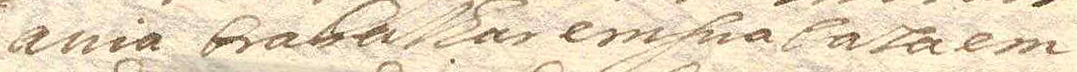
a via trabalhar em sua caza em
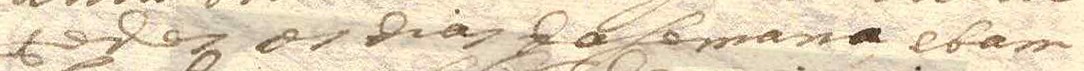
todos os dias da semana e tam
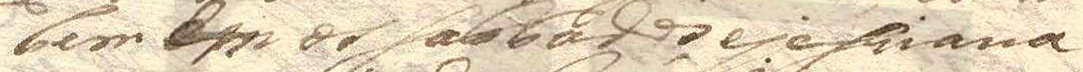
bem em os sabbados e jejuaua
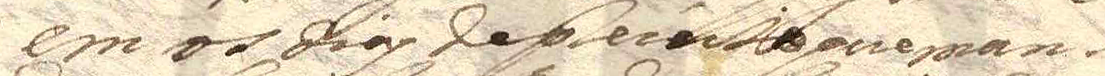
em os dias de preceito que man
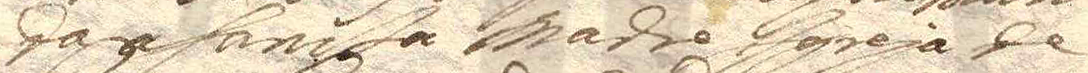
da a sancta Madre Igreja de
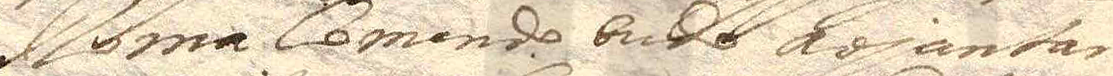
Roma Comendo tudo ao jantar
